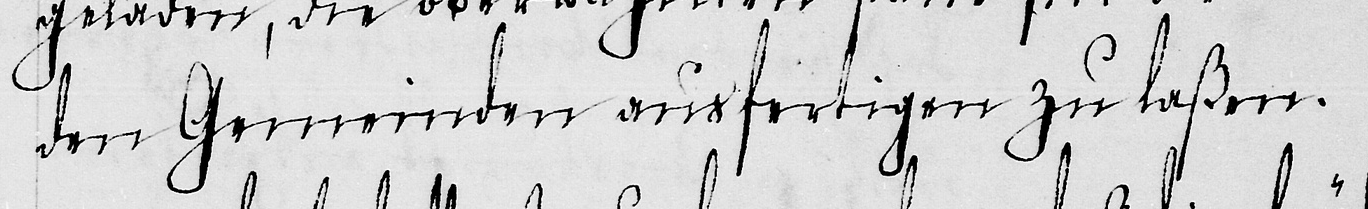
den Gemeinden ausfertigen zu laßen.
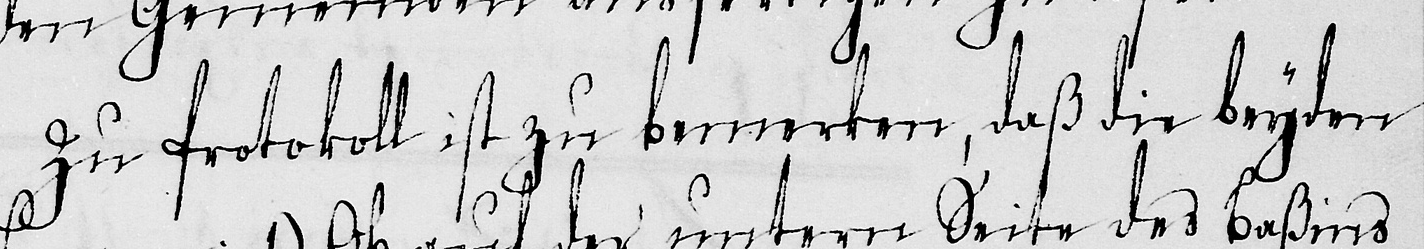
Zu Protokoll ist zu bemerken, daß die beyden
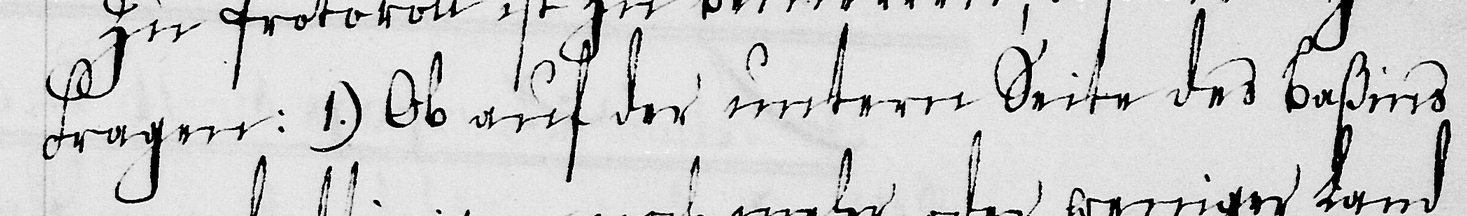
Fragen: 1.) Ob auf der untern Seite des Baßins
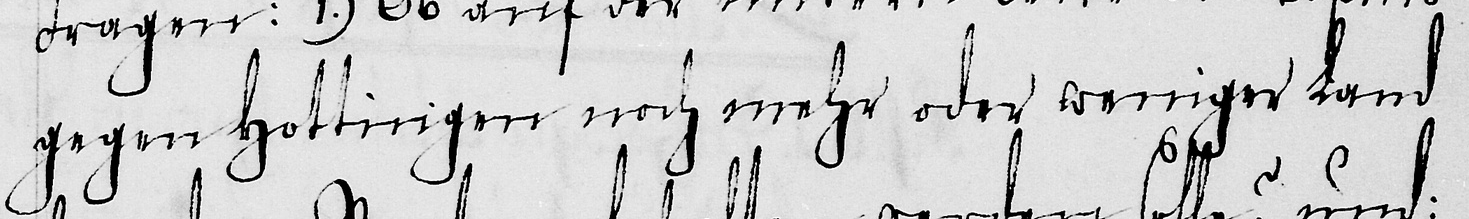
gegen Hottingen noch mehr oder weniger Land
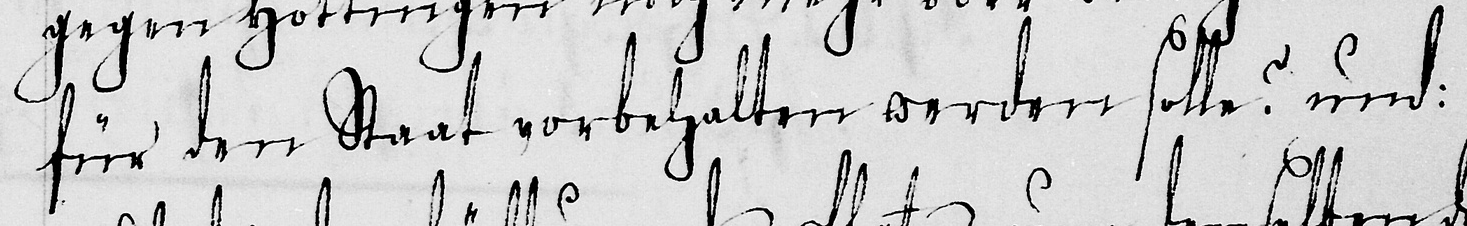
für den Staat vorbehalten werden solle? und:
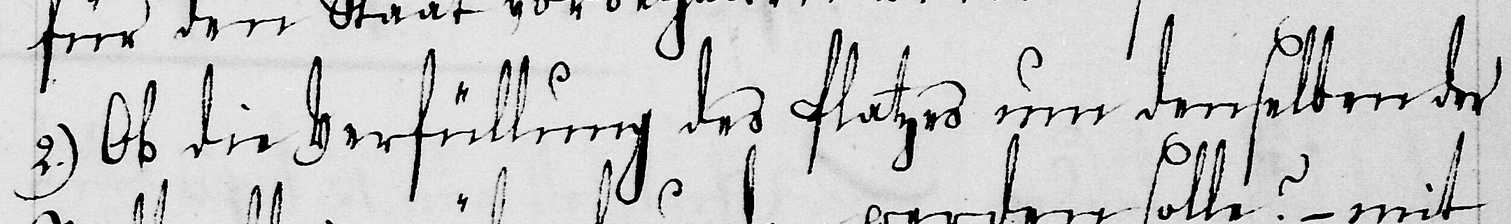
2.) Ob die Verfüllung des Platzes um denselben der
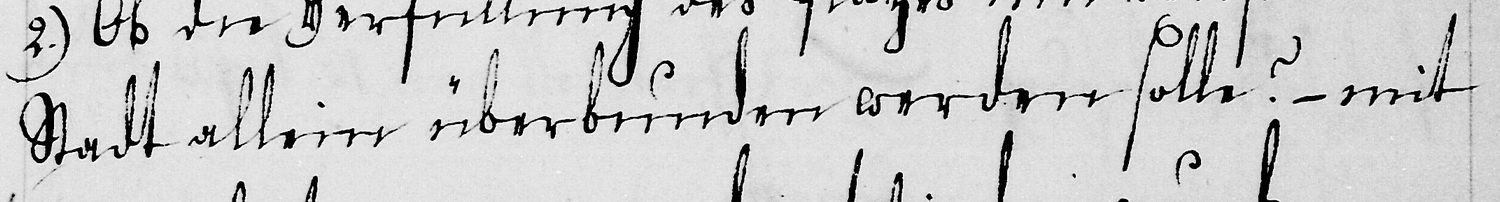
Stadt allein überbunden werden solle? – mit
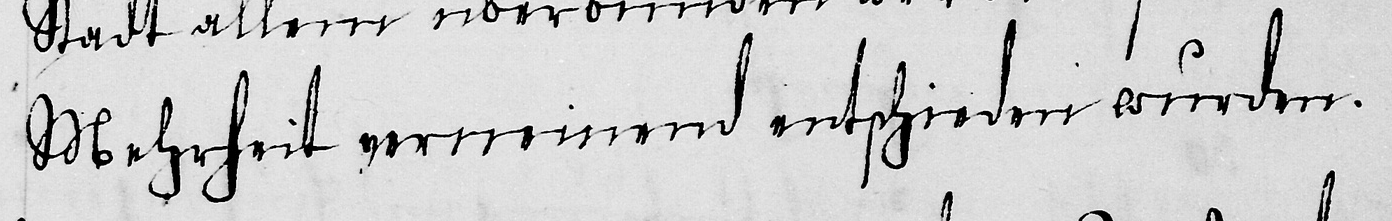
Mehrheit verneinend entschieden wurden.
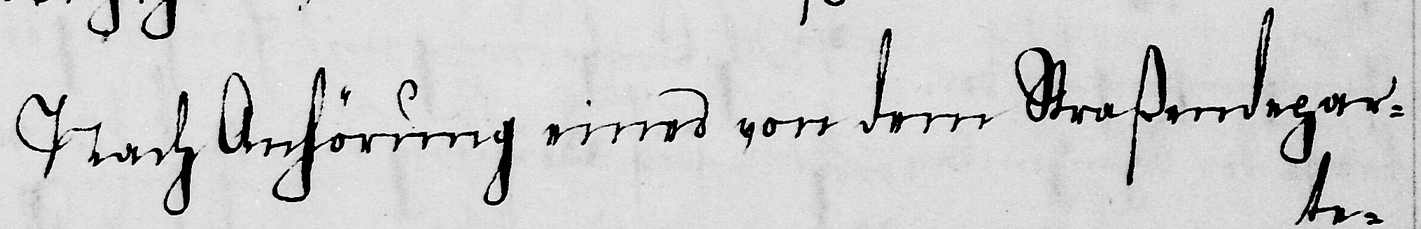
Nach Anhörung eines von dem Straßendepar-
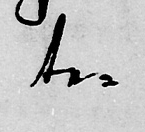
ten
